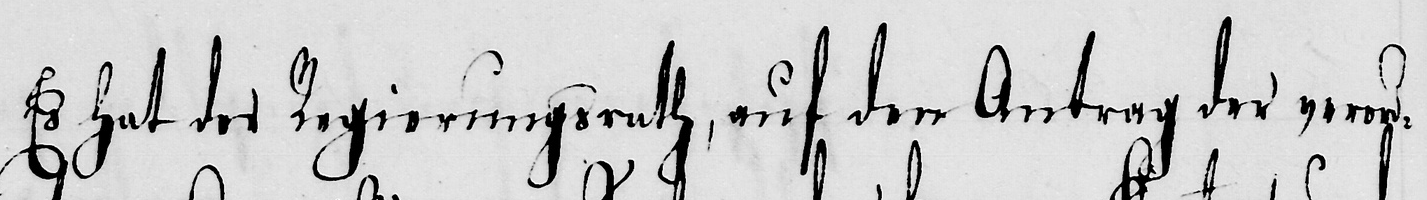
Es hat der Regierungsrath, auf den Antrag der veror¬
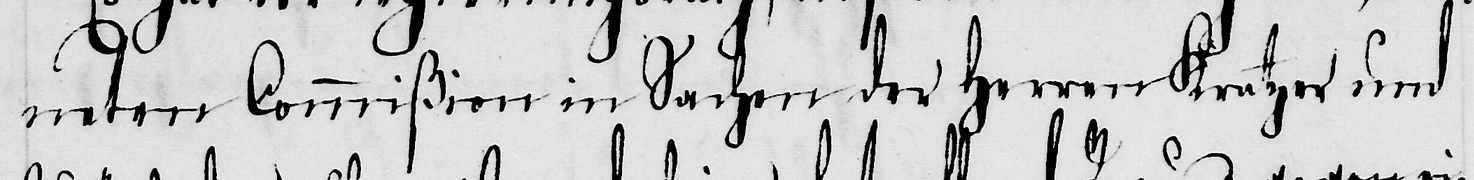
dneten Commißion in Sachen der Herren Kratzer und
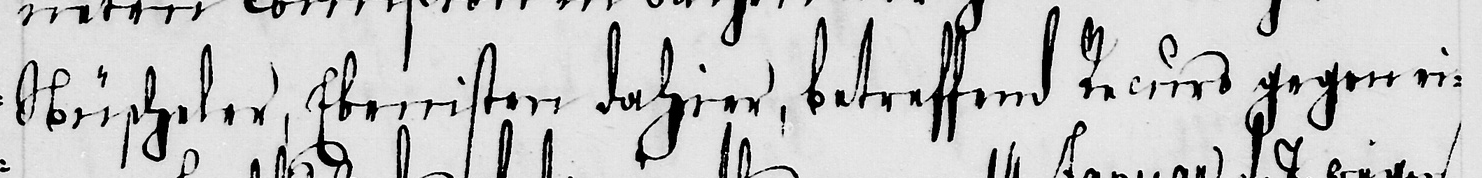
Nüscheler, Ebenisten dahier, betreffend Recurs gegen ei¬
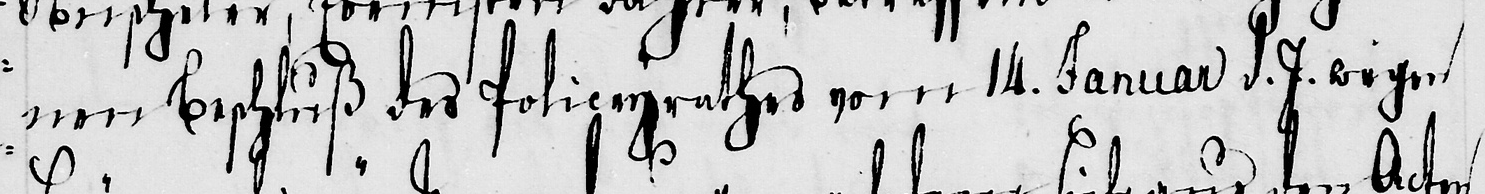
nen Beschluß des Policeyrathes vom 14. Januar d. J. wegen
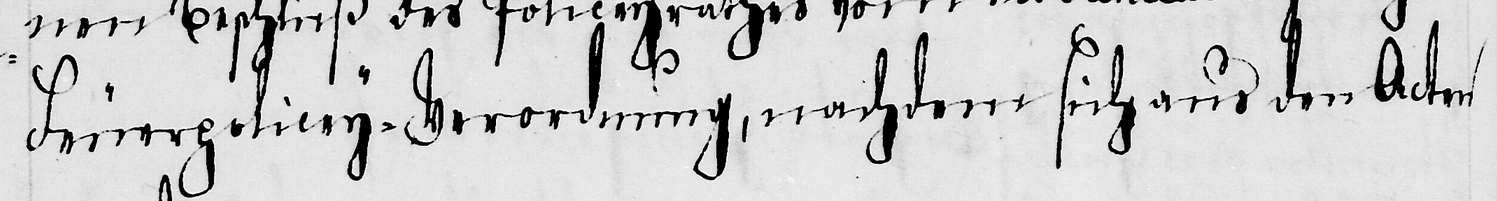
Feuerpolicey-Verordnung, nachdem sich aus den Acten
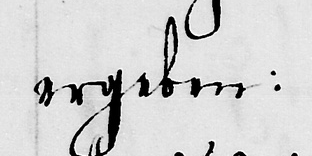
ergeben:
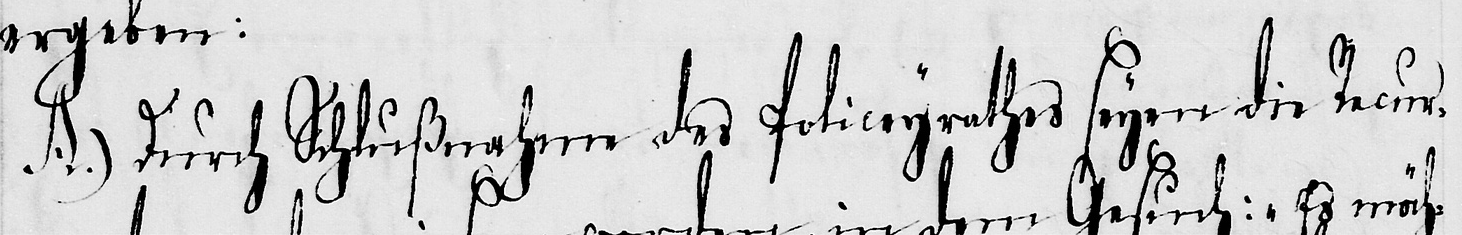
A.) Durch Schlußnahme des Policeyrathes seyen die Recu¬
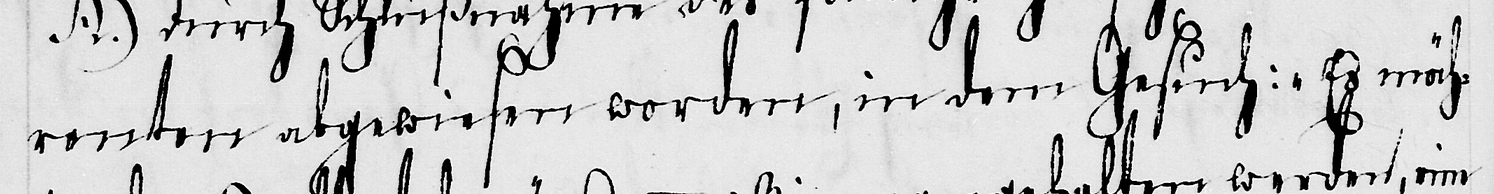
rrenten abgewiesen worden, in dem Gesuch: „Es möch¬
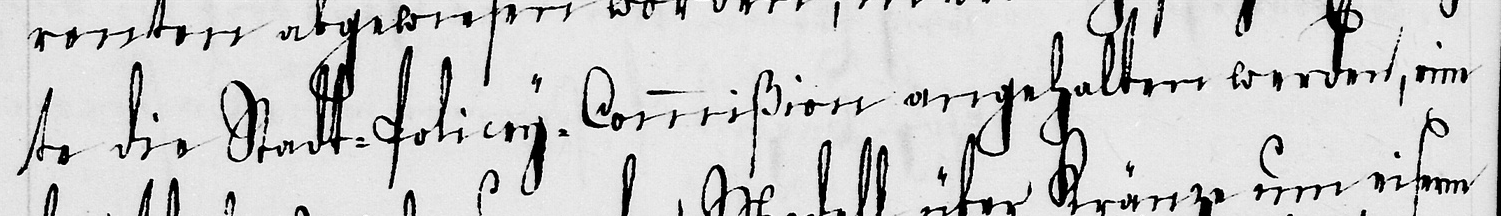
te die Stadt-Policey-Commißion angehalten werden, eine
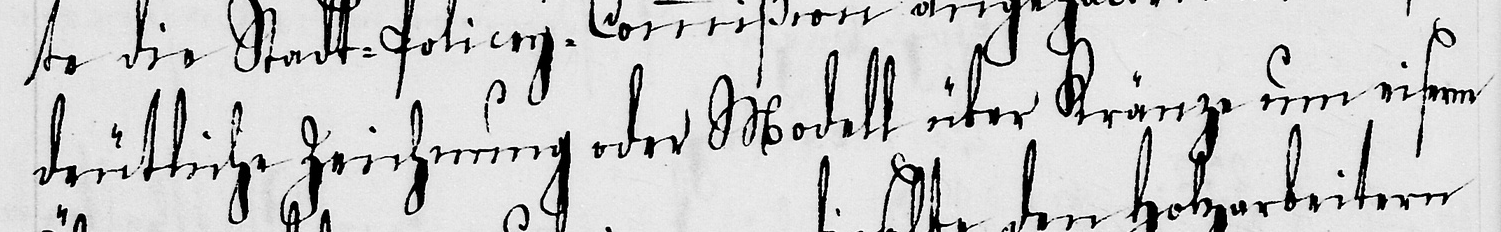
deutliche Zeichnung oder Modell über Kränze um eise¬
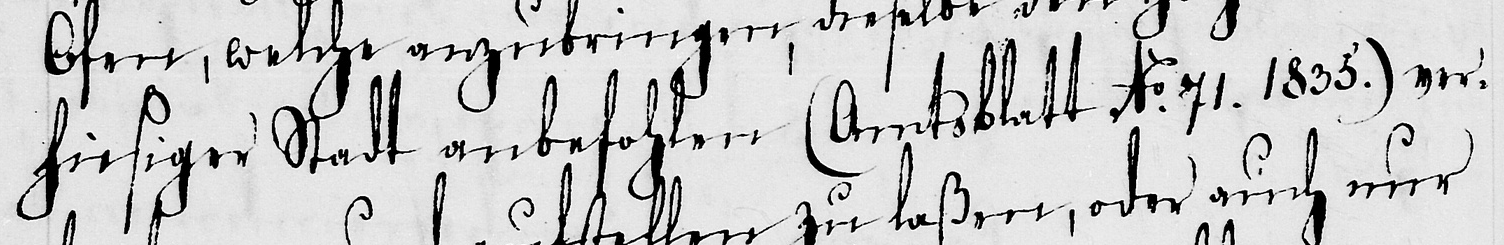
hiesiger Stadt anbefohlen (Amtsblatt N°. 71. 1835) ver¬
